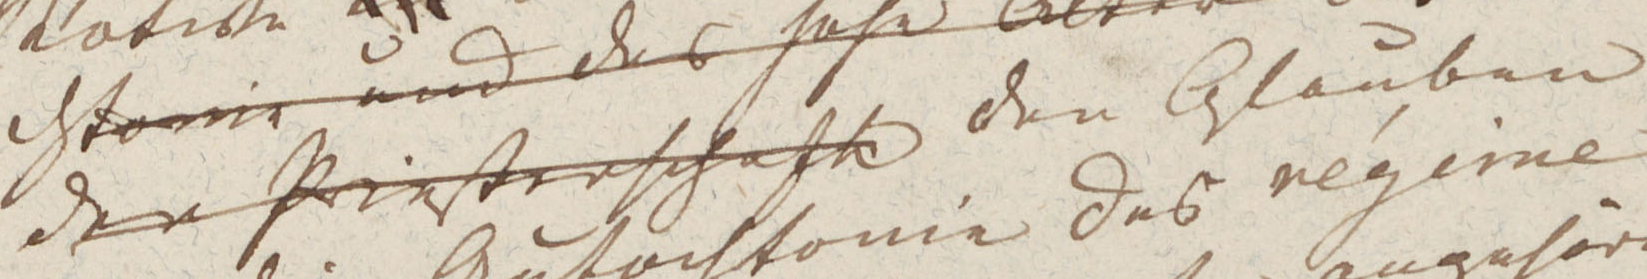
den Priesterschaft den Glauben
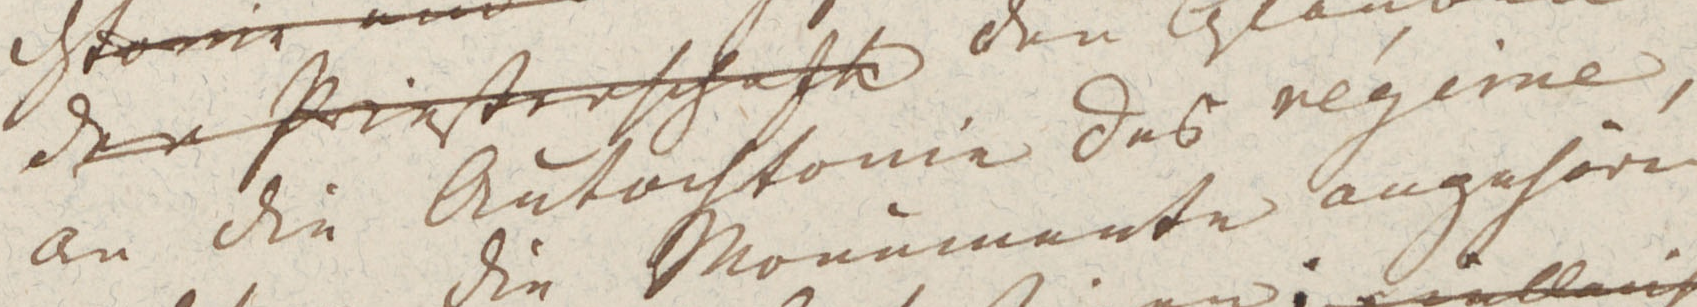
an die Autochtonie des régime,
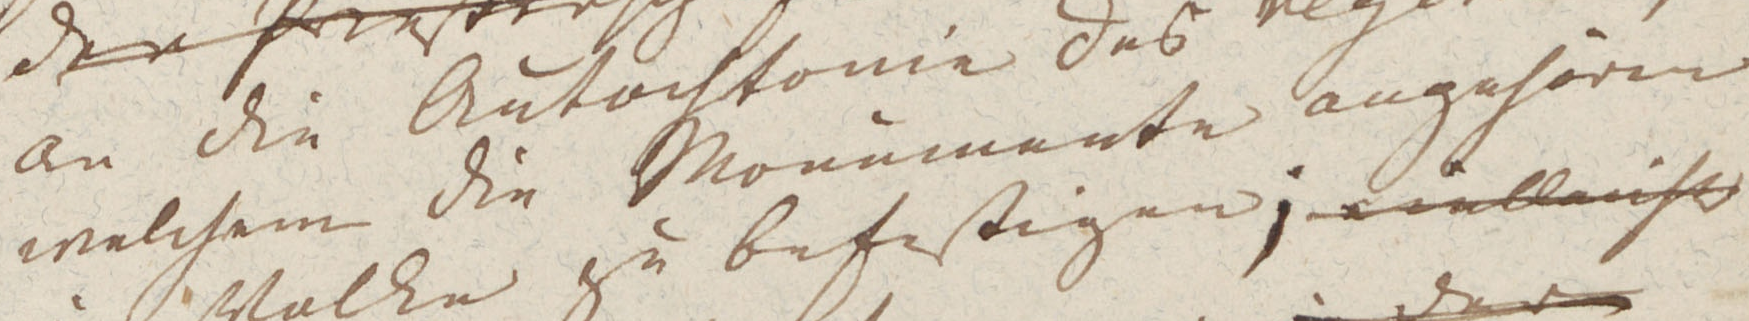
welchem die Monumente angehören
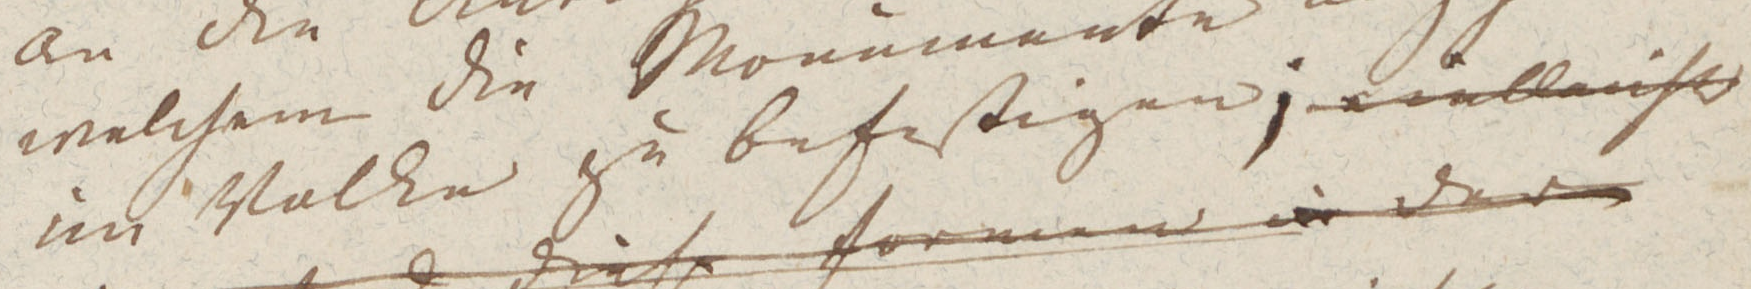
im Volke zu befestigen; vielleicht
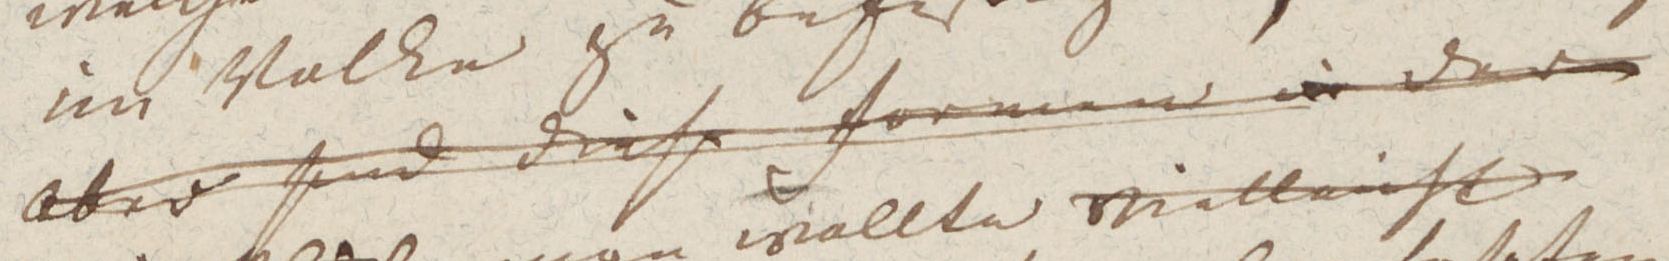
aber sind diese Formen in der
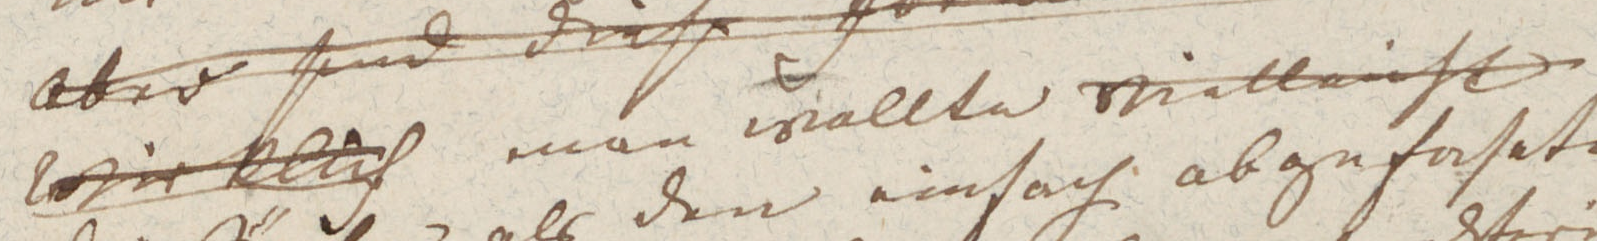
Wirklich man wollte vielleicht
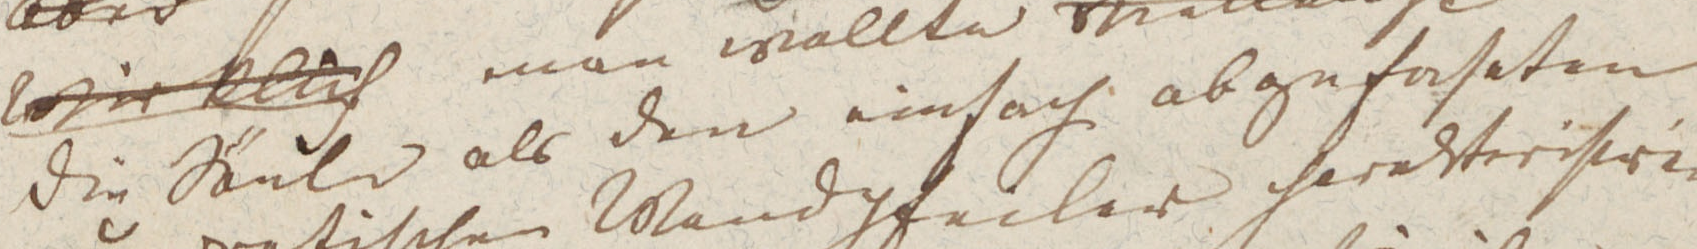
die Säule als den einfach abgefaseten
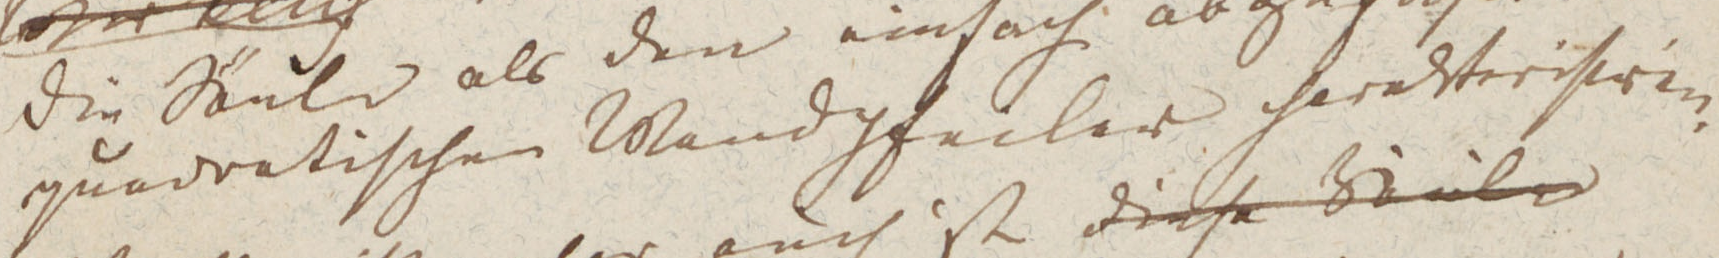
quadratischen Wandpfeiler charakterisiren.
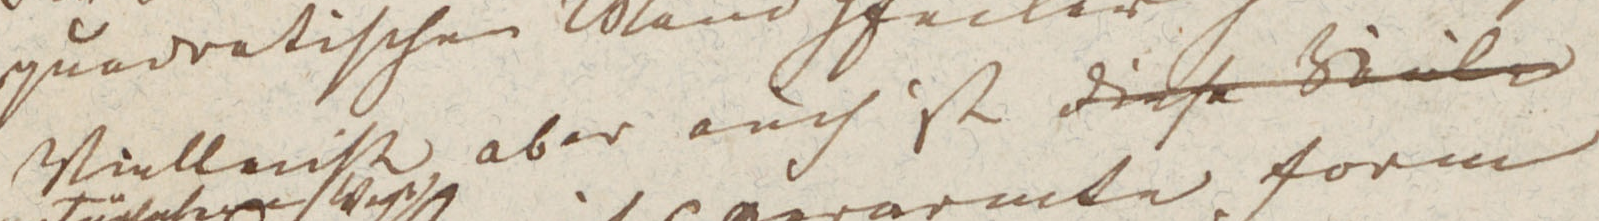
Vielleicht aber auch ist diese Säule
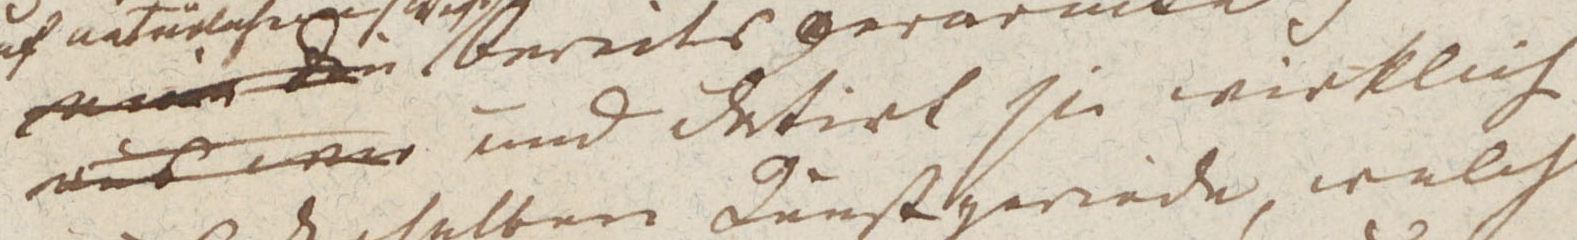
aus und datirt sie wirklich
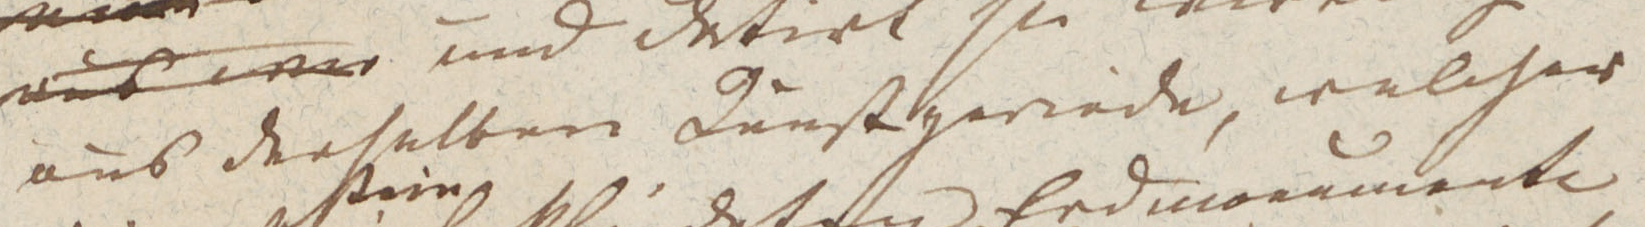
aus derselben Kunstperiode, welcher
